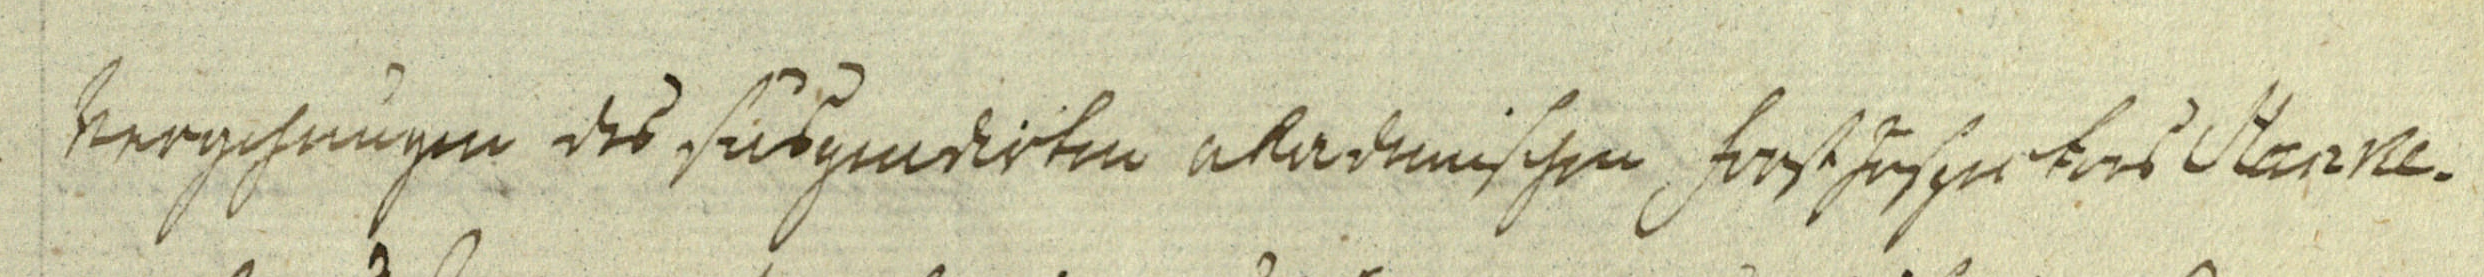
Vergehungen des supendirten akademischen ForstInspectores Hanke.
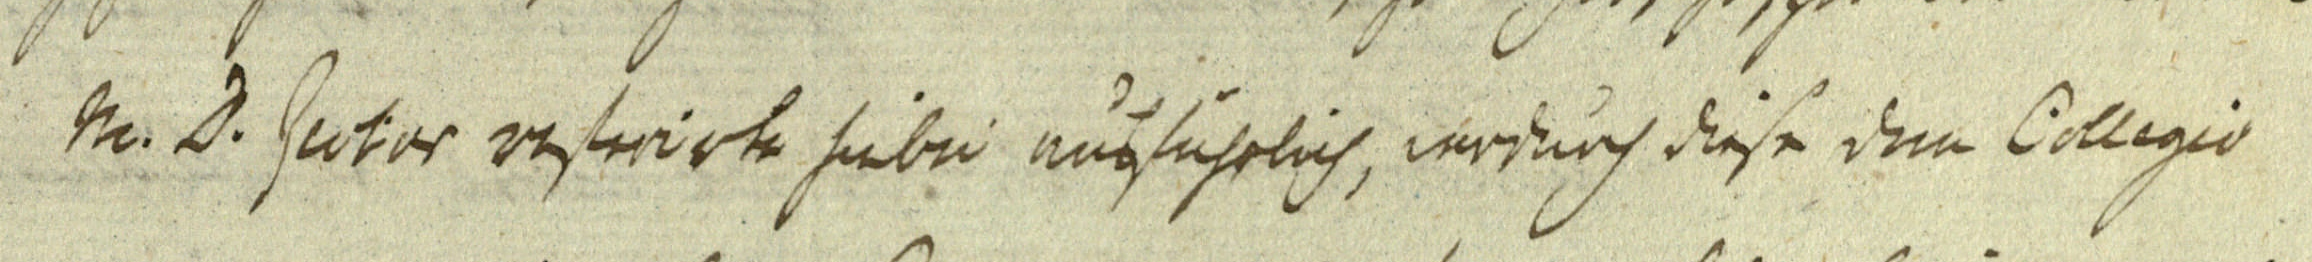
M. D. Rector referirte hiebei ausführlich, wodurch diese dem Collegio
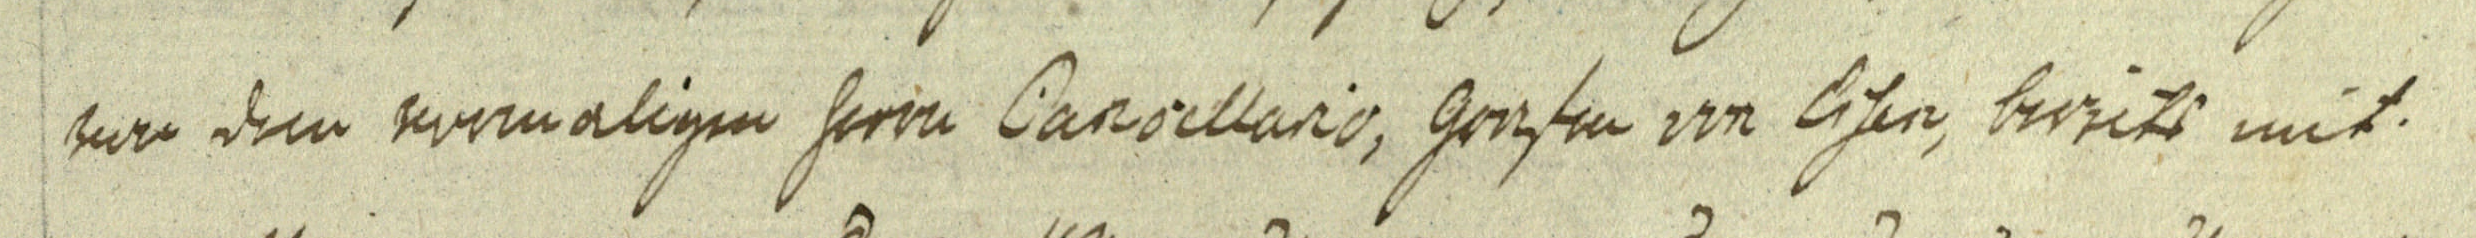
von dem vormaligen Herrn Cancellario, Grafen von Essen bereits mit¬
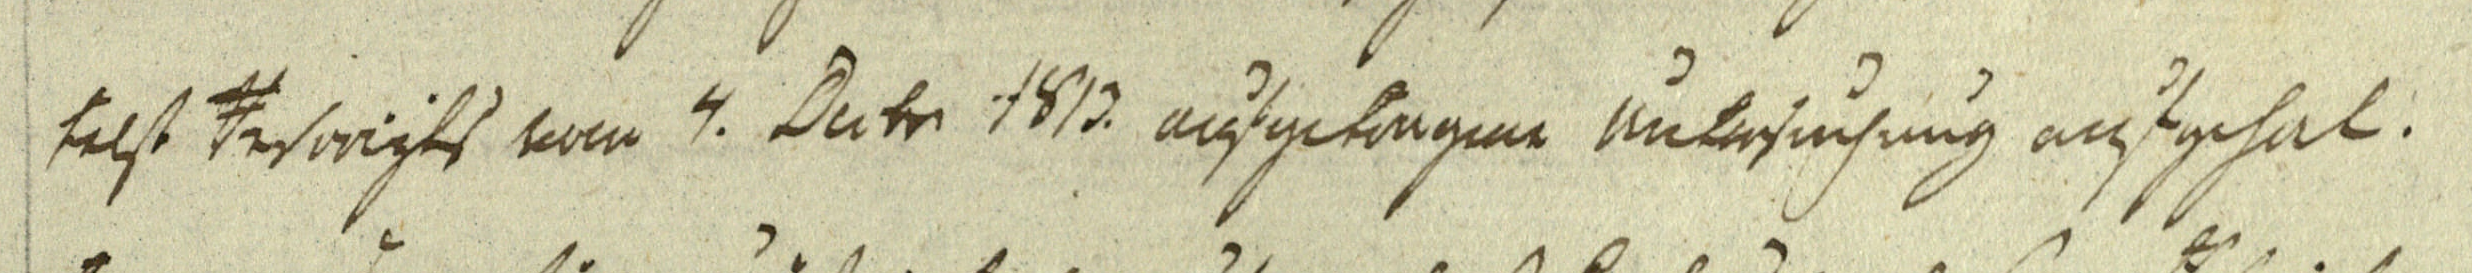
telst Rescripts vom 4. Decbr. 1813. aufgetragene Untersuchung aufgehal¬
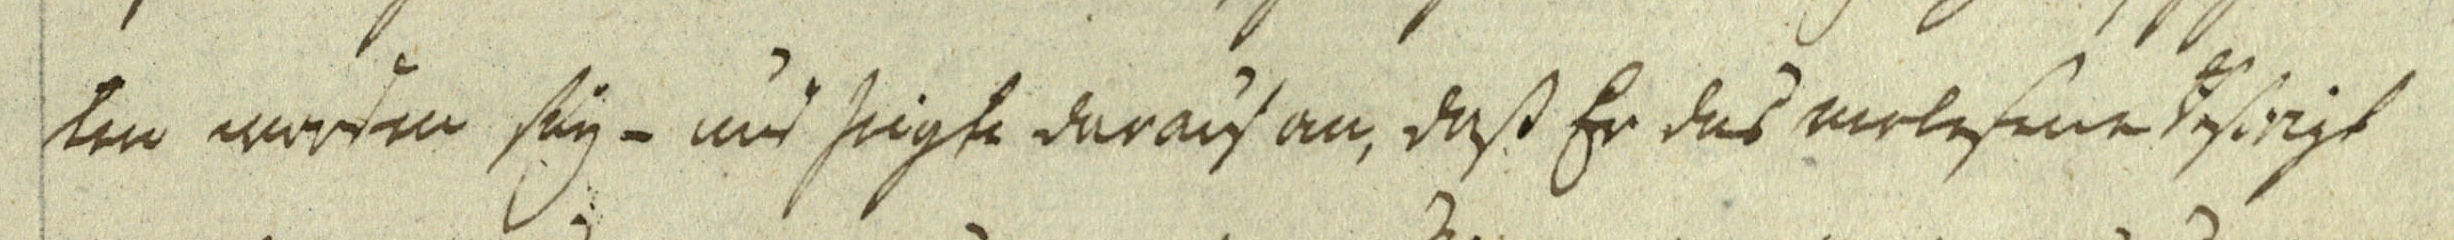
ten worden seÿ - und zeigte darauf an, daß Er das verlesene Rescript
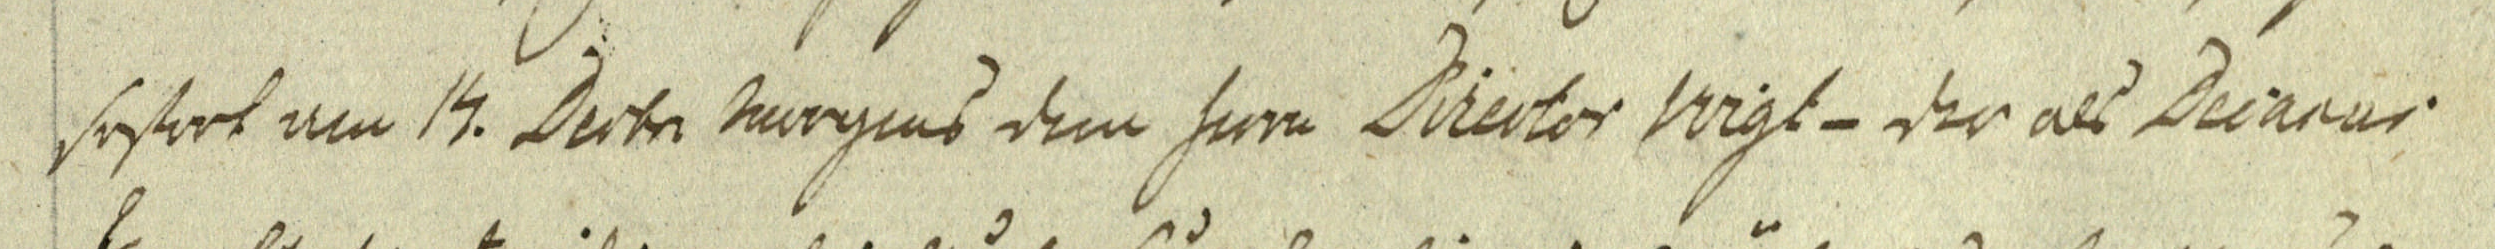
sofort am 14. Decbr Morgens dem Herrn Director Voigt - der als Decanus
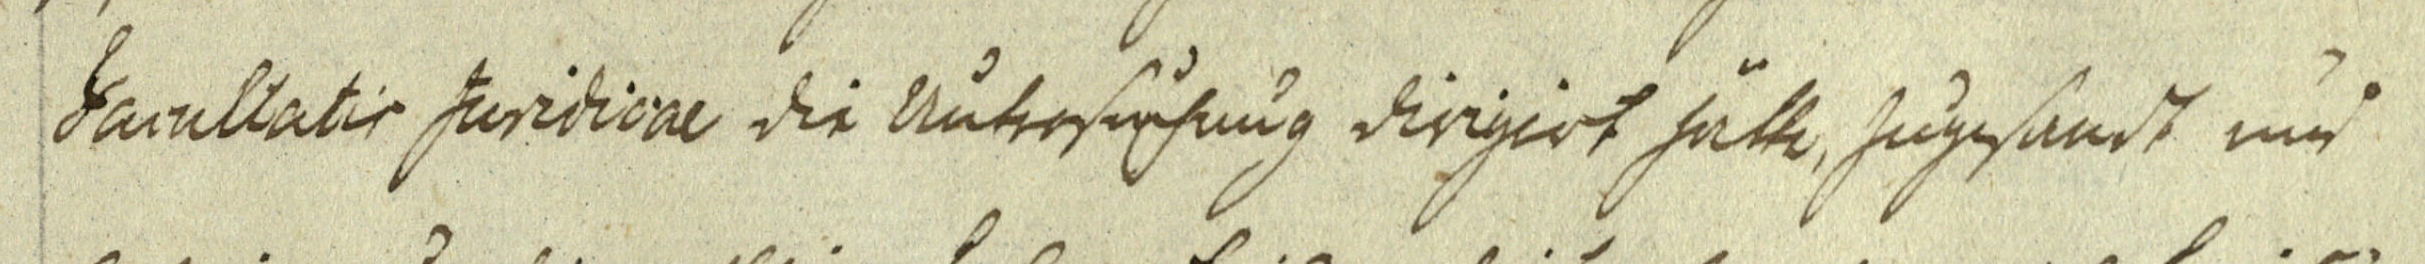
Facultatis Juridicae die Untersuchung dirigirt hätte, zugesandt und
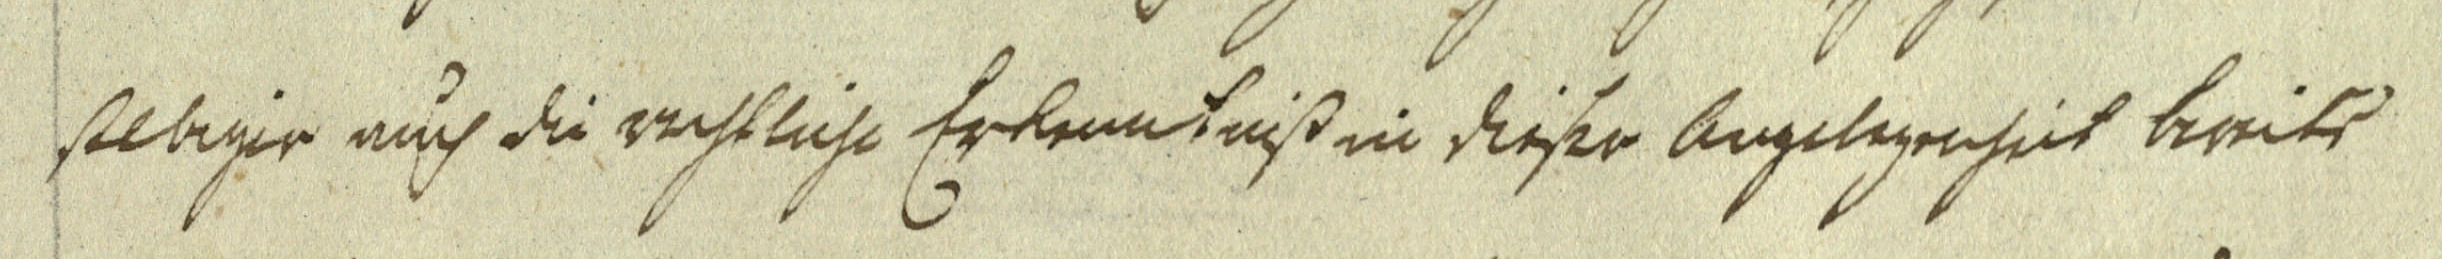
selbiger auch die rechtliche Erkenntniß in dieser Angelegenheit bereits
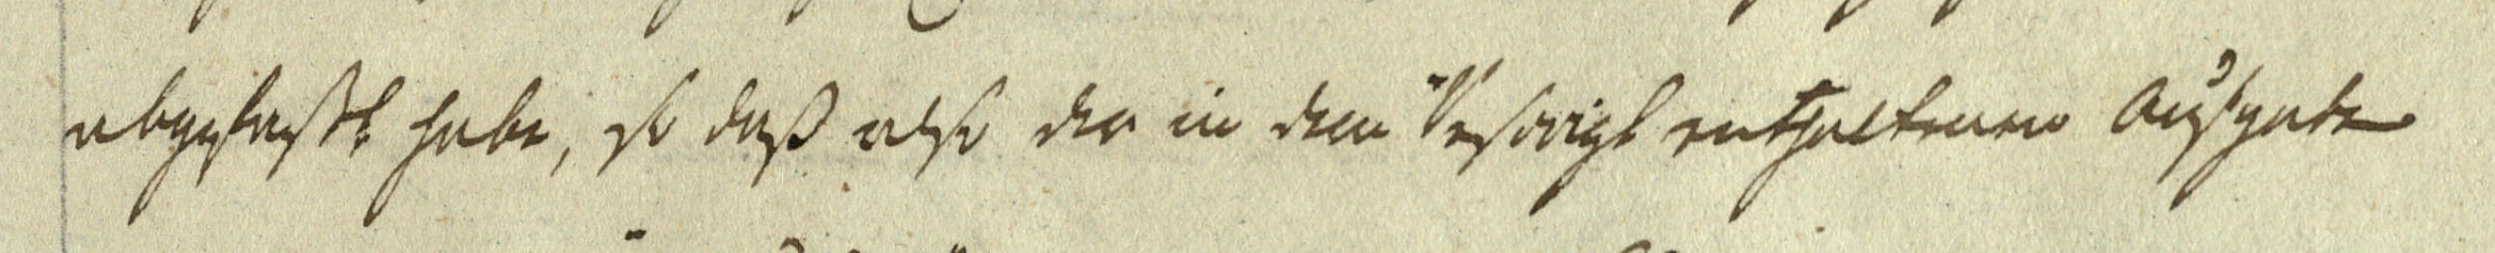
abgefaßt habe, so daß also der in dem Rescript enthaltenen Aufgabe
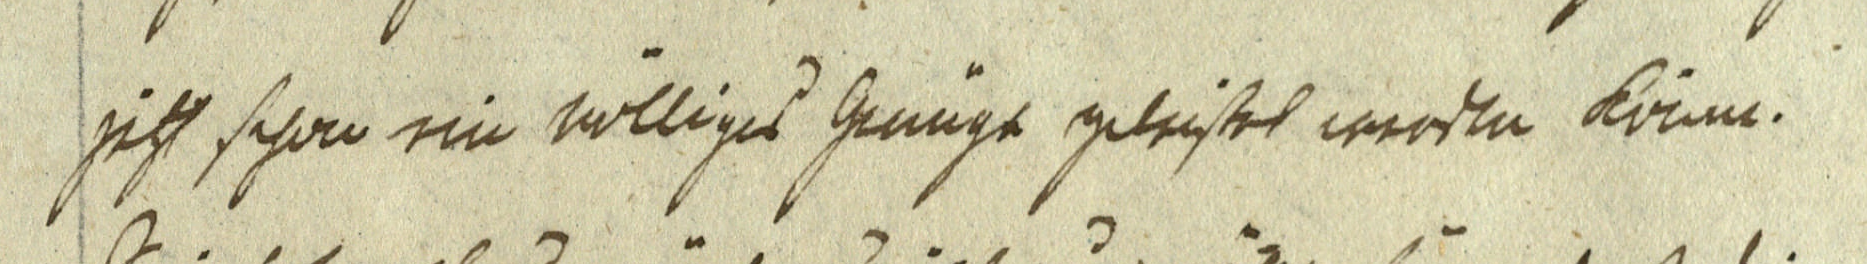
jetzt schon ein völliges Genüge geleistet werden könne.
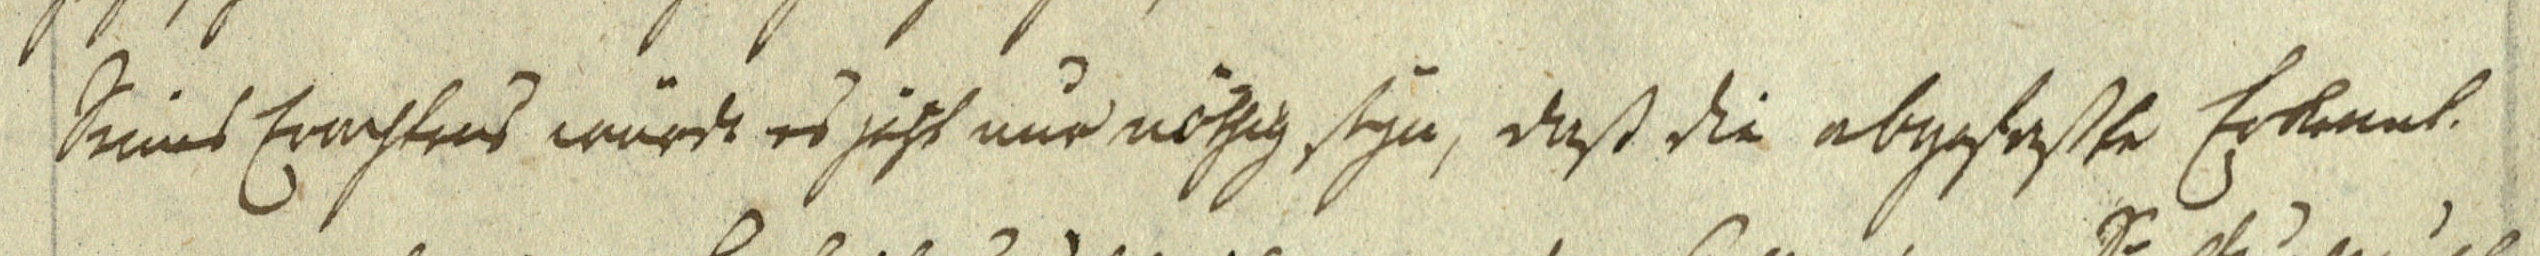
Seines Erachtens würde es jetzt nur nöthig seÿn, daß die abgefaßte Erkennt¬
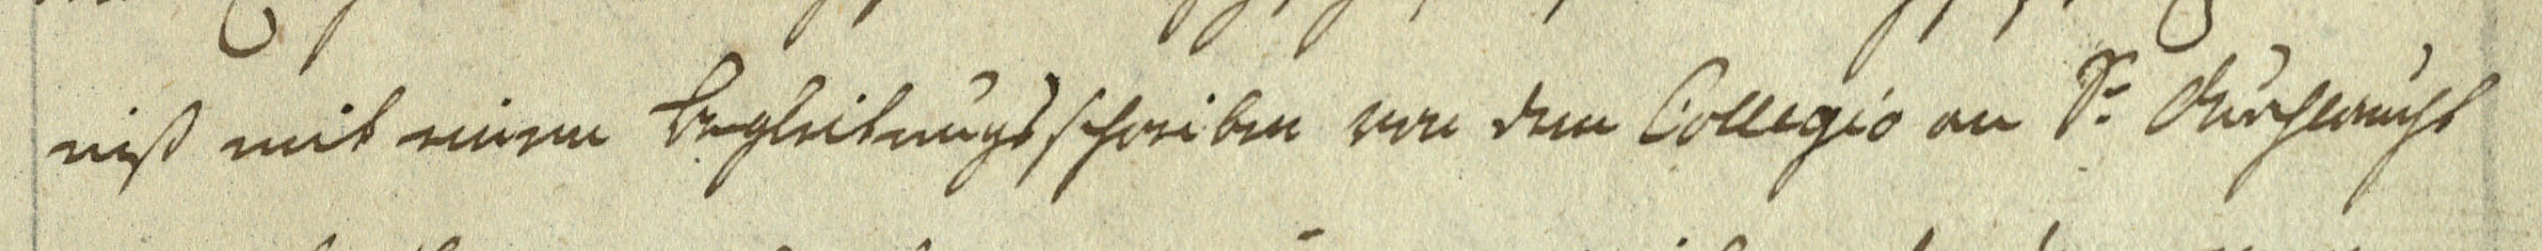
niß mit einem Begleitungsschreiben von dem Collegio an Sr. Durchlaucht
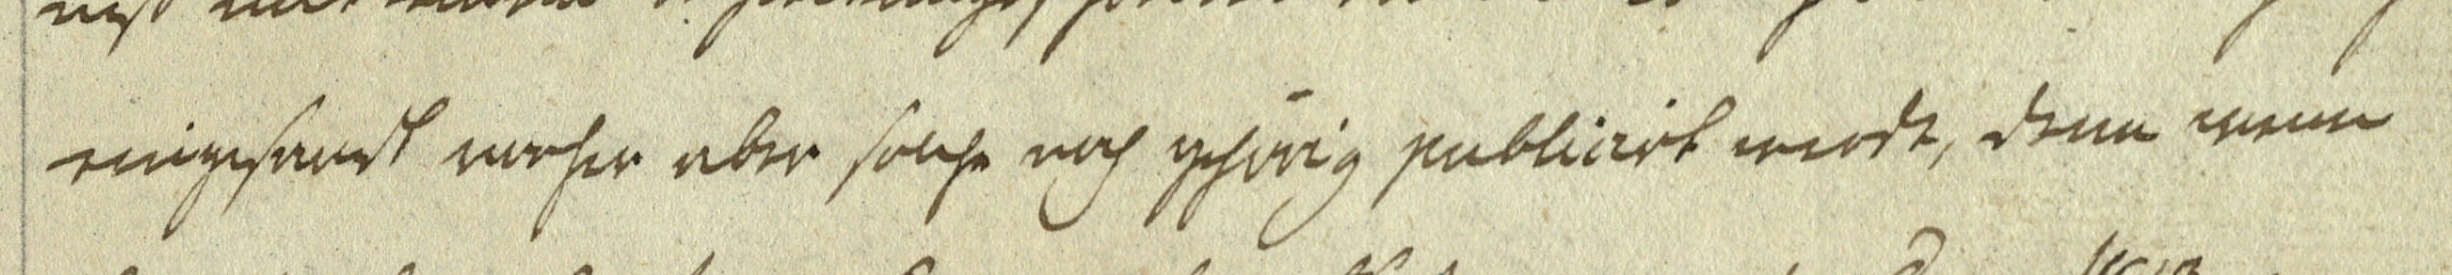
eingesandt vorher aber solche noch gehörig publicirt werde, denn wenn
